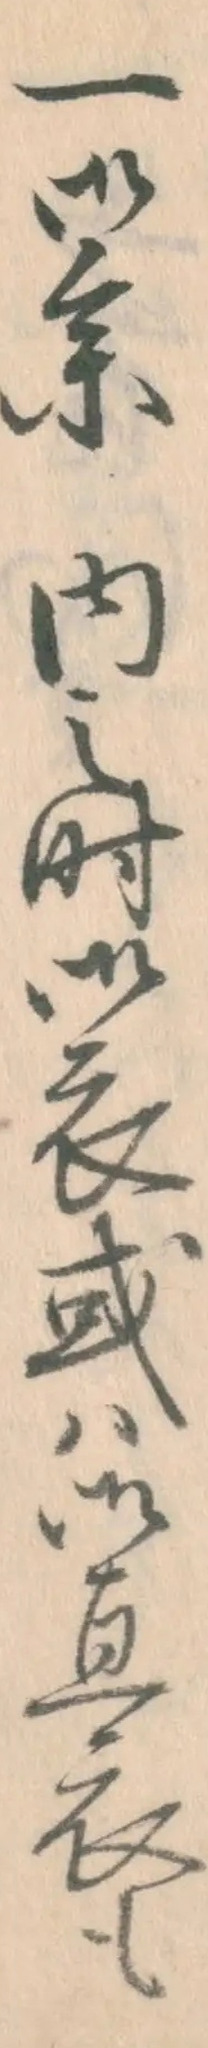一御参内之時御衣或ハ御直衣も
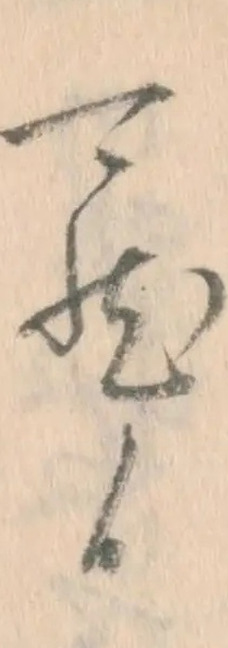可然候
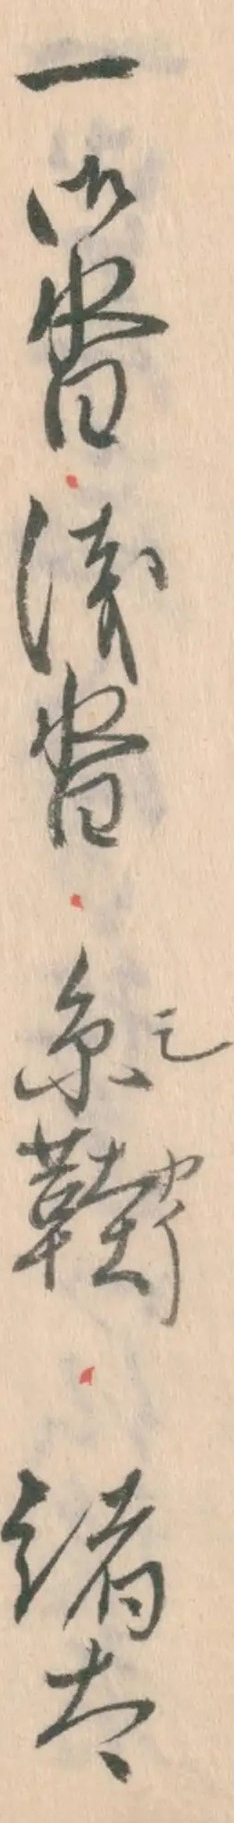一御沓浅沓糸鞋緒太
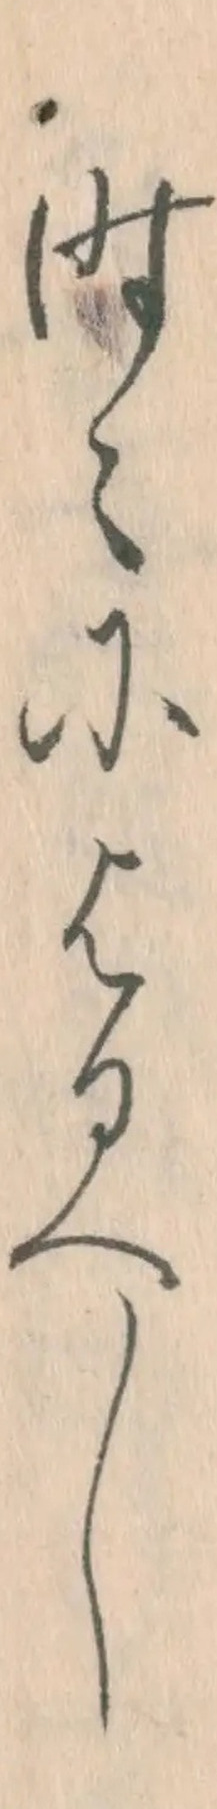時々ニよるへし
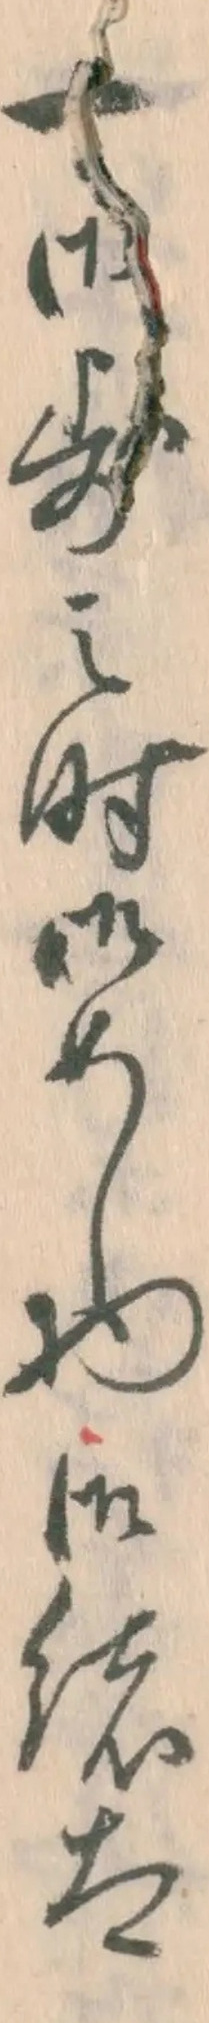一御歩之時御めし物・御緒太
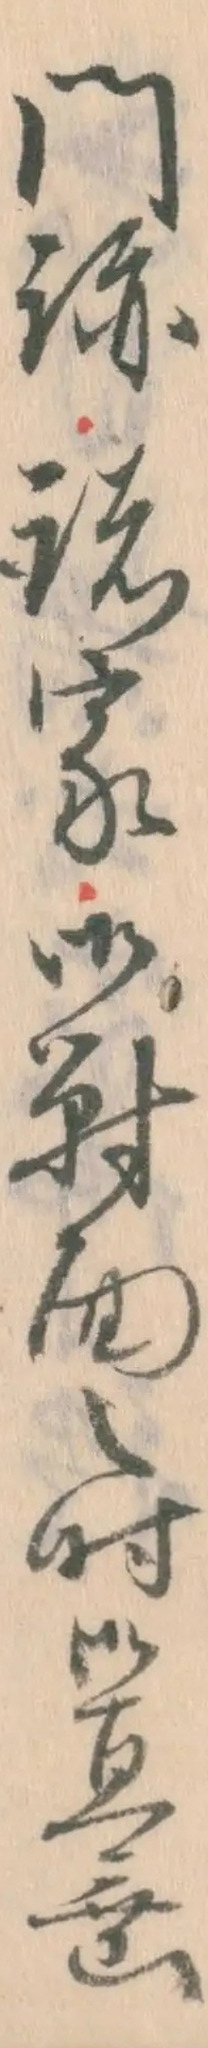門跡・諸家・御対面之時御直垂
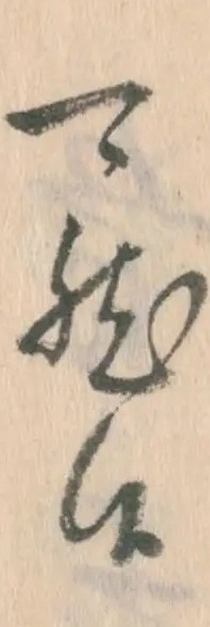可然候
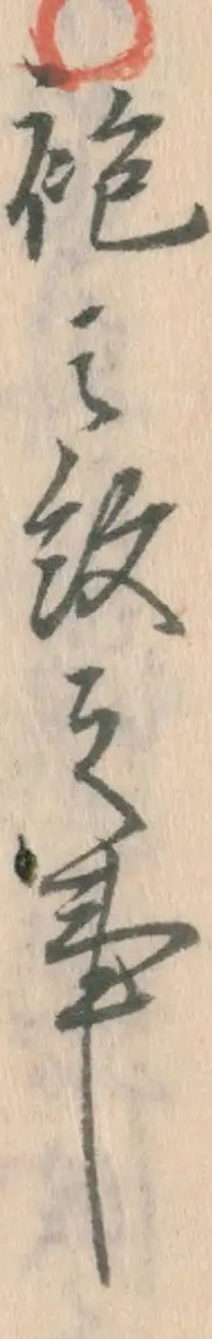○袍之紋之事
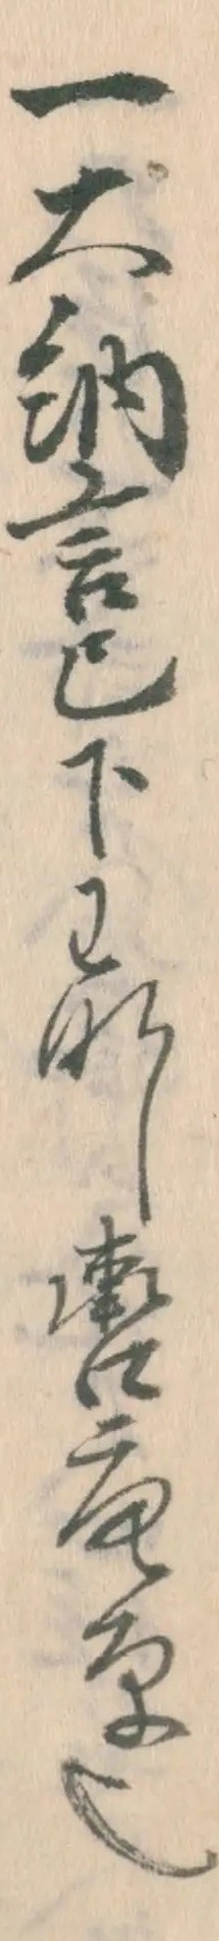一大納言已下わなし轡唐草也
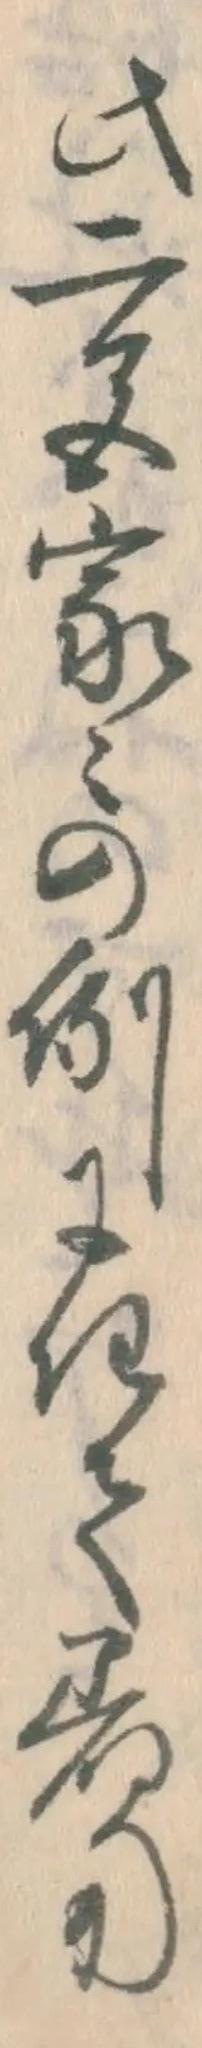此二色家々の例に任て着用
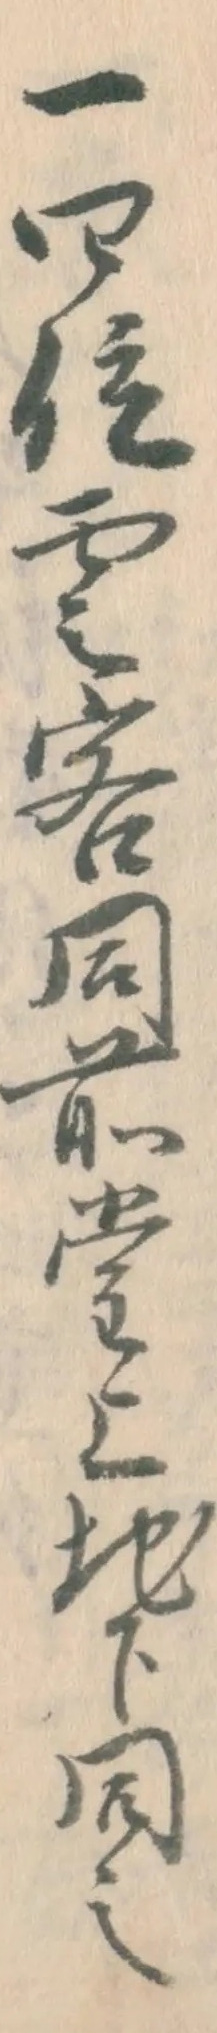一四位雲客同前堂上地下同也
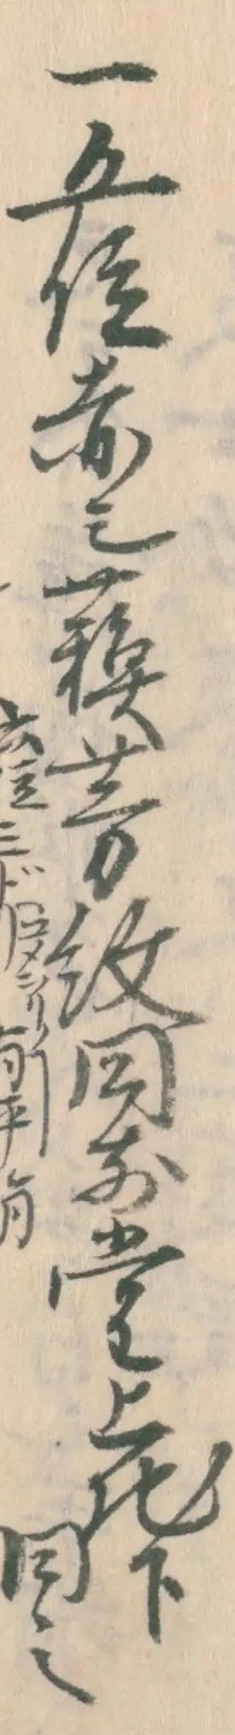一五位赤シ蘇芳紋同前堂上地下同也
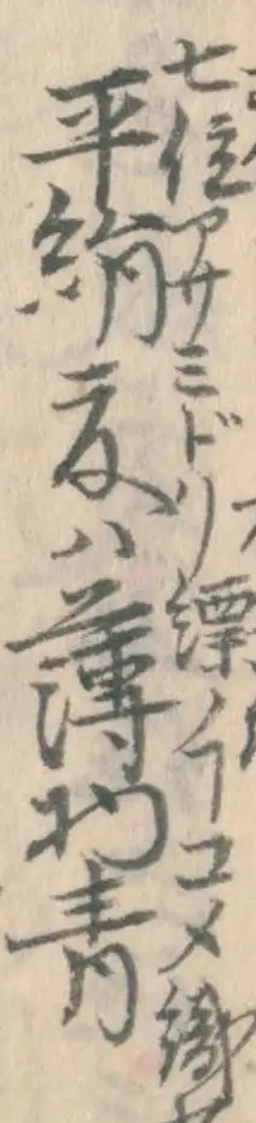平絹夏は薄物青

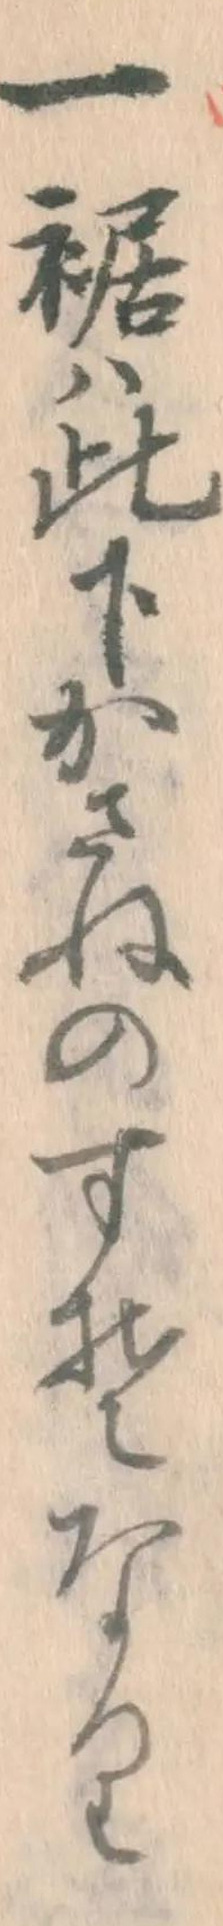一裾ハ此下かさねのすそなり
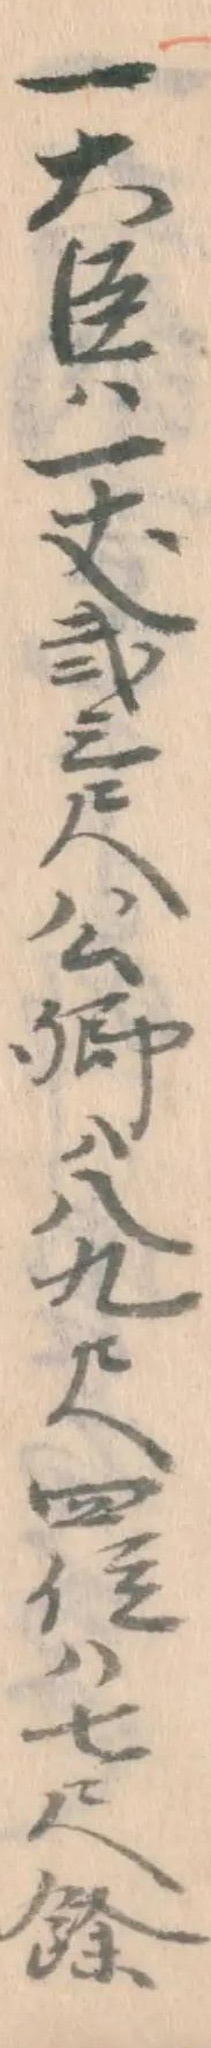一大臣ハ一丈弐尺公卿ハ八九尺四位ハ七尺余
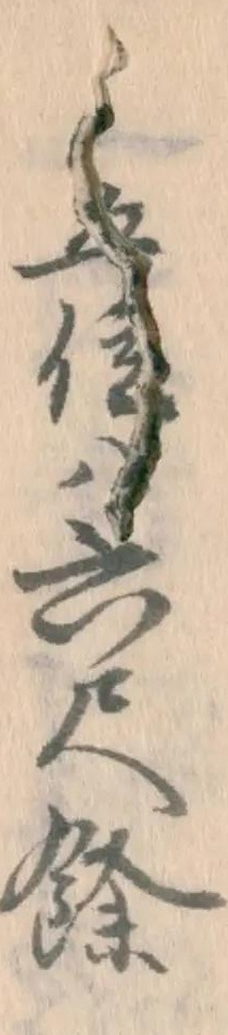五位六尺余
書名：賀茂社記録. 第80冊
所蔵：国立国会図書館 National Diet Library, JAPAN
